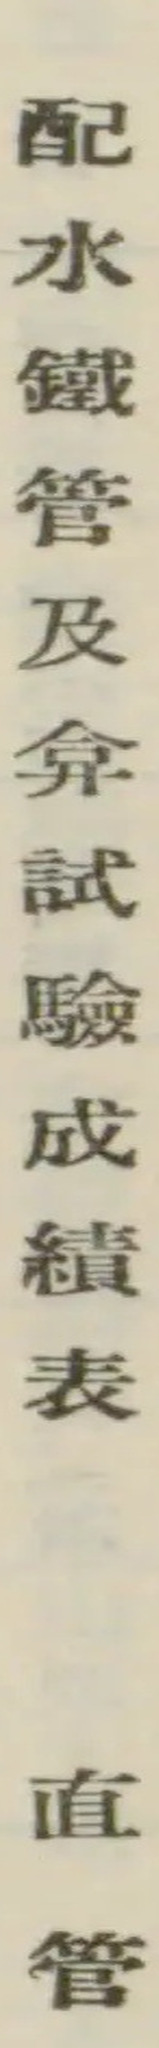配水鐵管及弇試験成績表直管

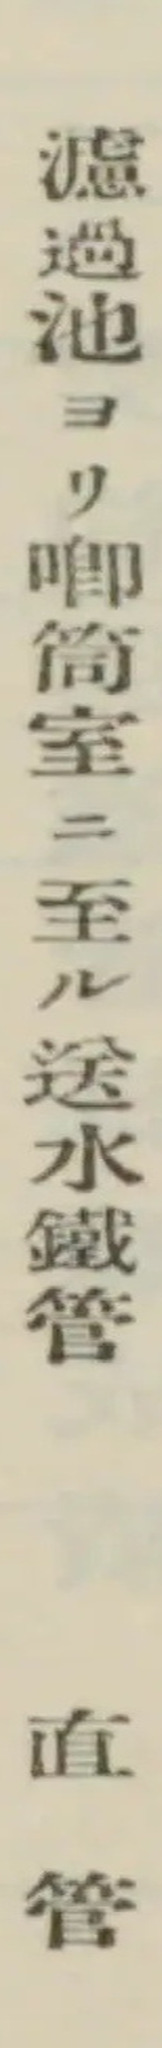濾過池より喞筒室に至る送水鐵管直管
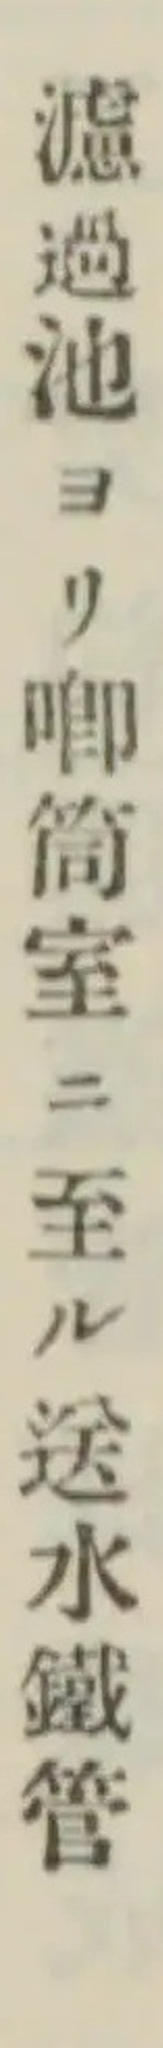濾過池より喞筒室に至る送水鐵管直管
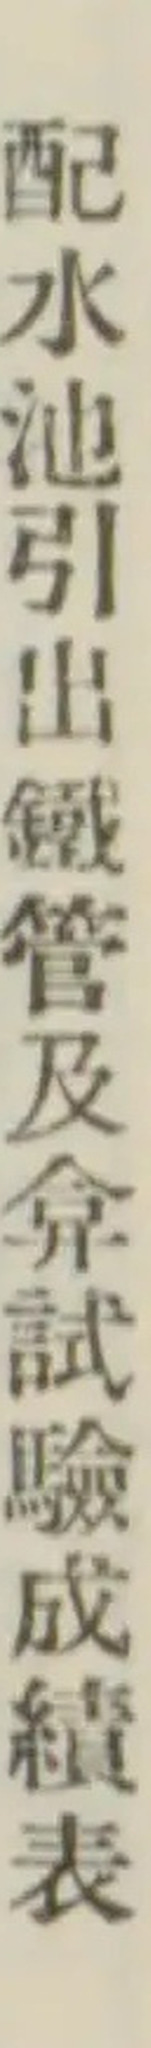配水池引出鐵管及弇試験成績表直管

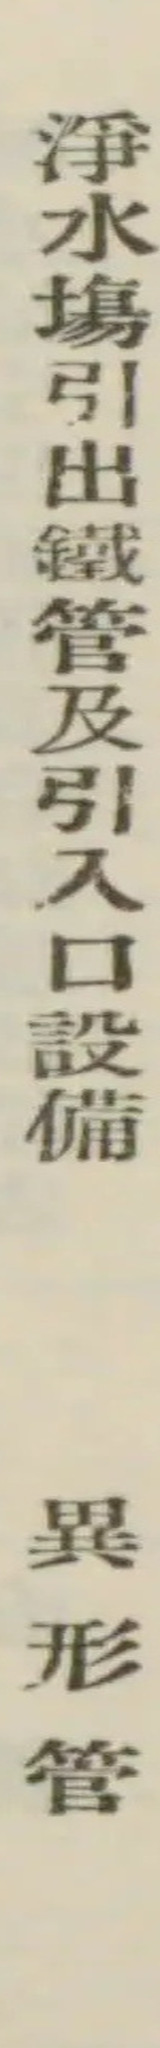浄水場引出鐵管及引入口設備異形管

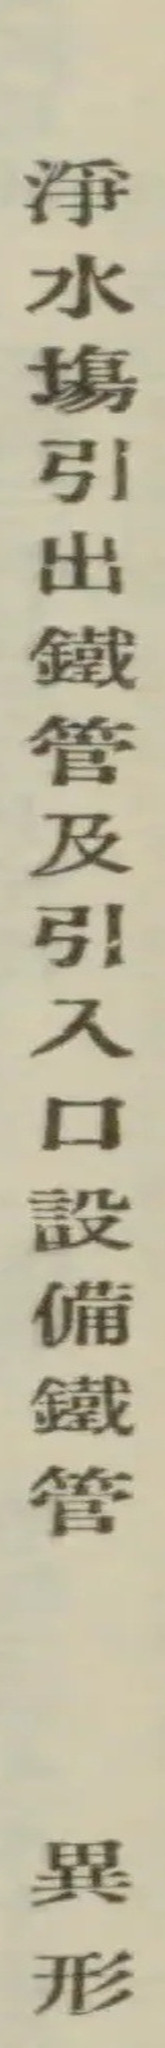浄水場引出鐵管及引入口設備鐵管異形管
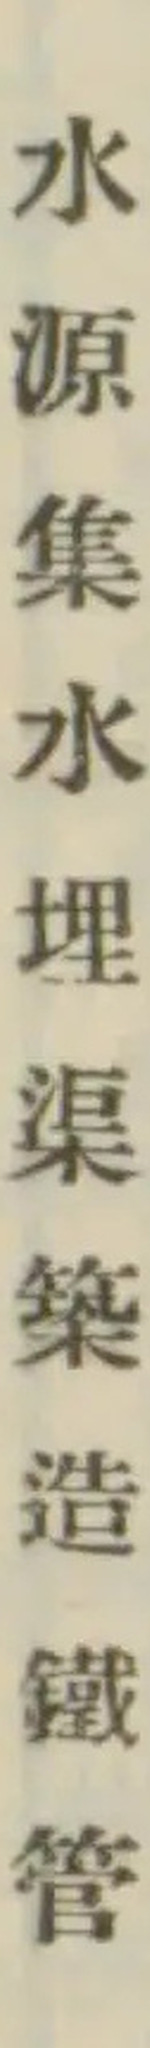水源集水埋渠築造鐵管

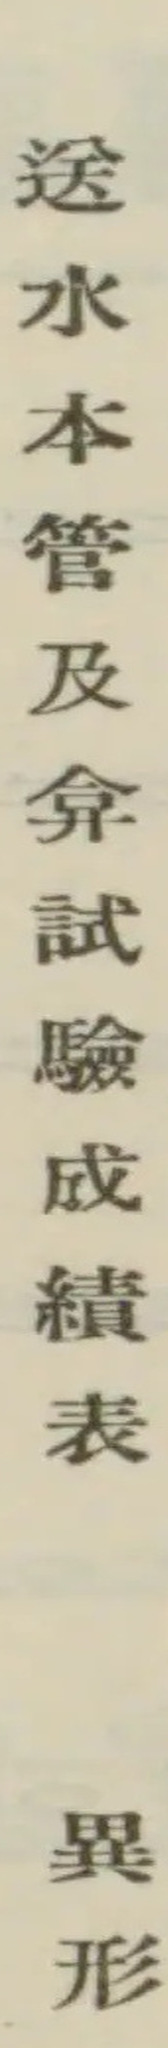送水本管及弇試験成績表異形管
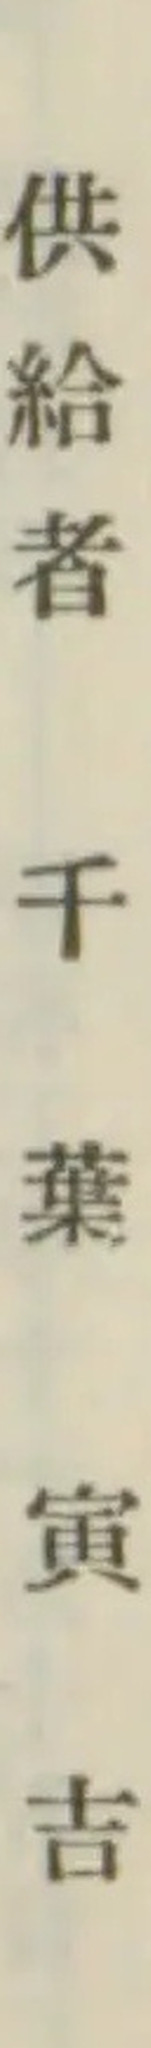供給者千葉寅吉
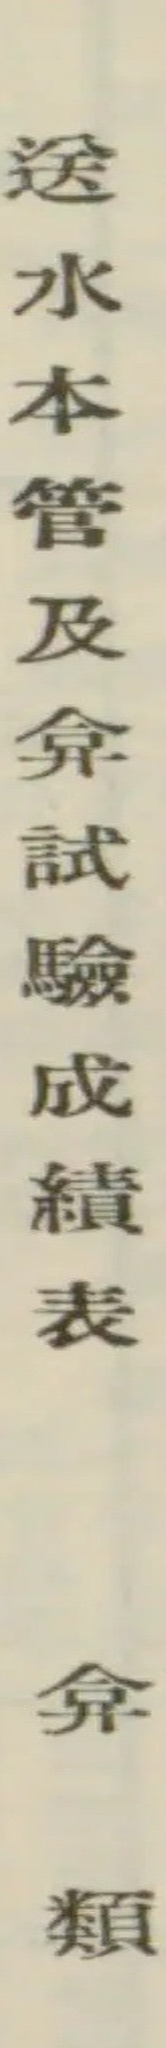送水本管及弇試験成績表弇類

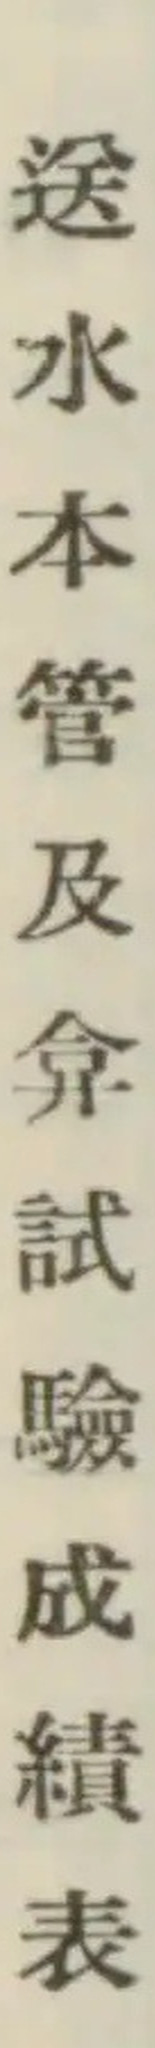送水本管及弇試験成績表
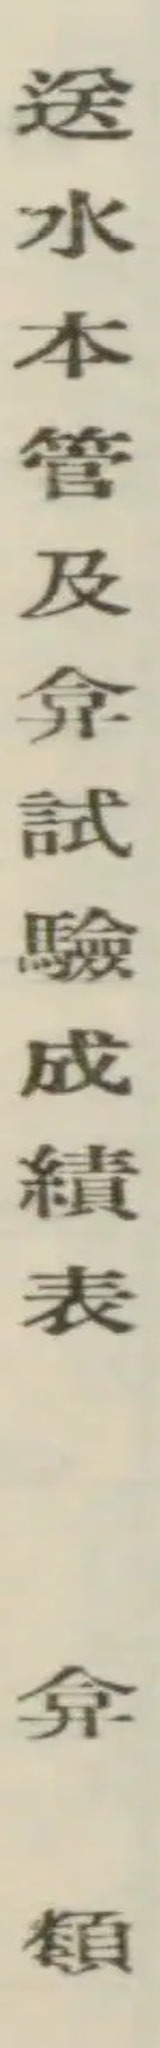送水本管及弇試験成績表
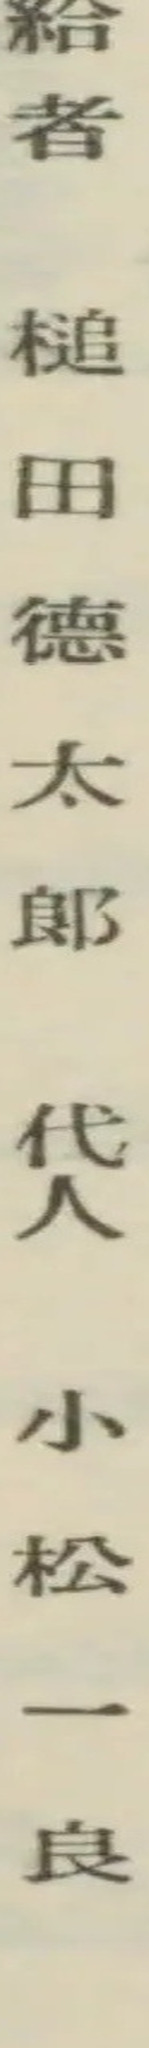供給者槌田徳太郎代人小松一良
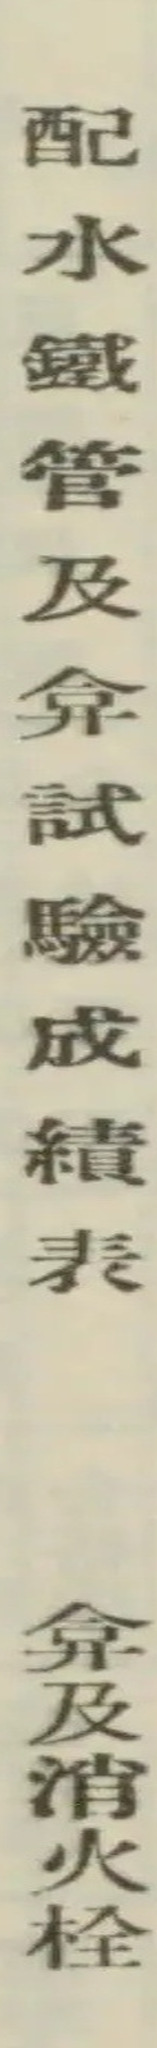送水本管及弇試験成績表
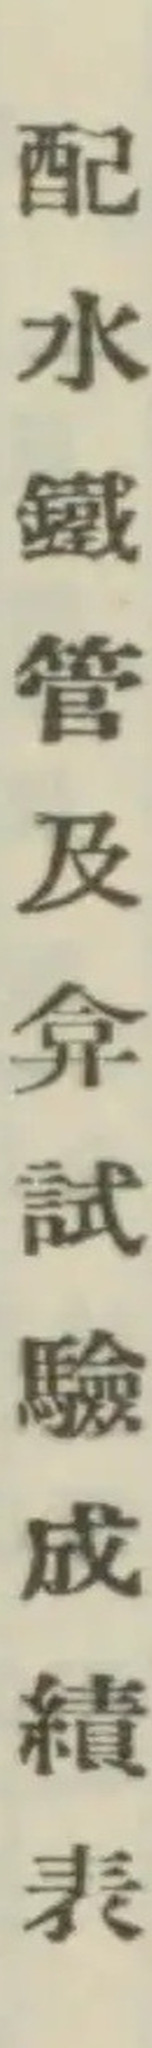送水本管及弇試験成績表
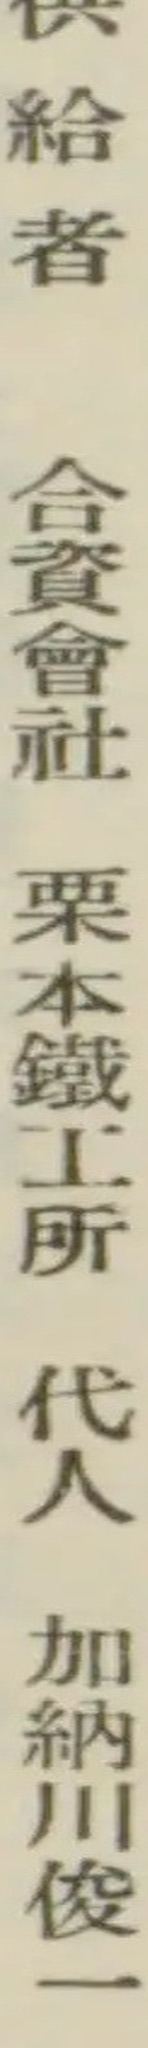供給者合資会社栗本鐵工所代人加納川俊一
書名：豊橋市水道誌
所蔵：国立国会図書館 National Diet Library, JAPAN
